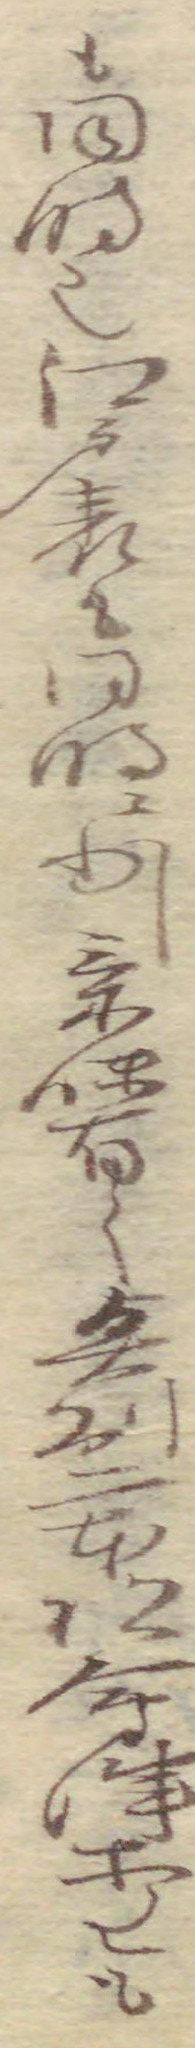も同時也江戸表も同時ニ少し気味有之奥州二本松会津等ニても
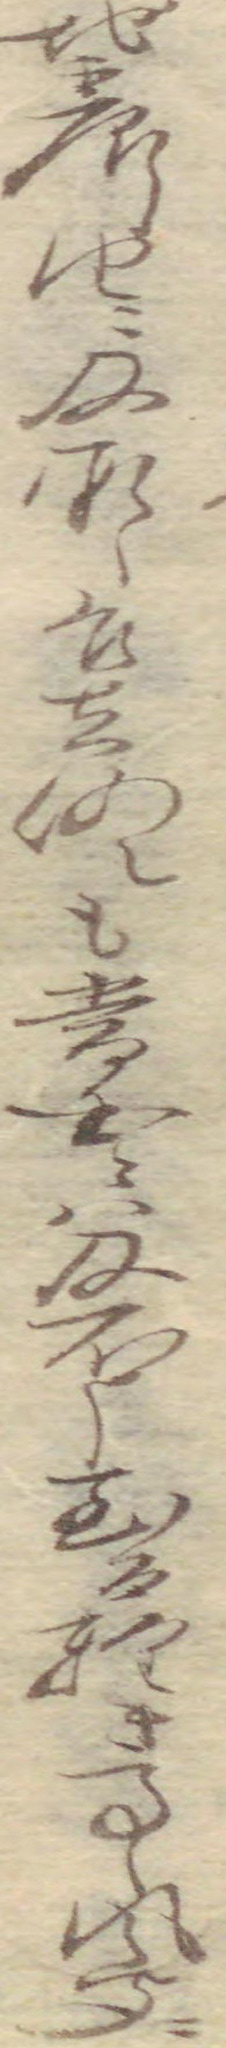地震之由ニ及承候乍去何レも当国ニハ及不申至て軽き事之風聞ニ
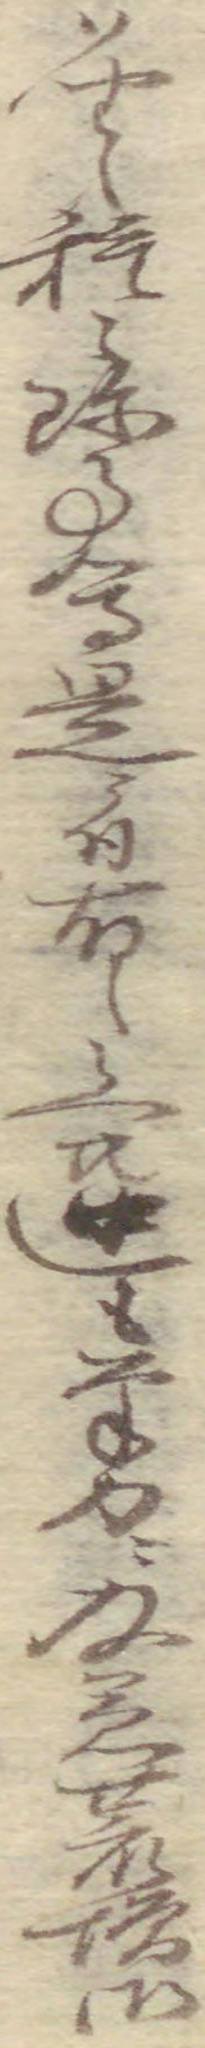御座候種〻余事等是ニ付有之候へ共迚も筆力ニ及兼荒増御
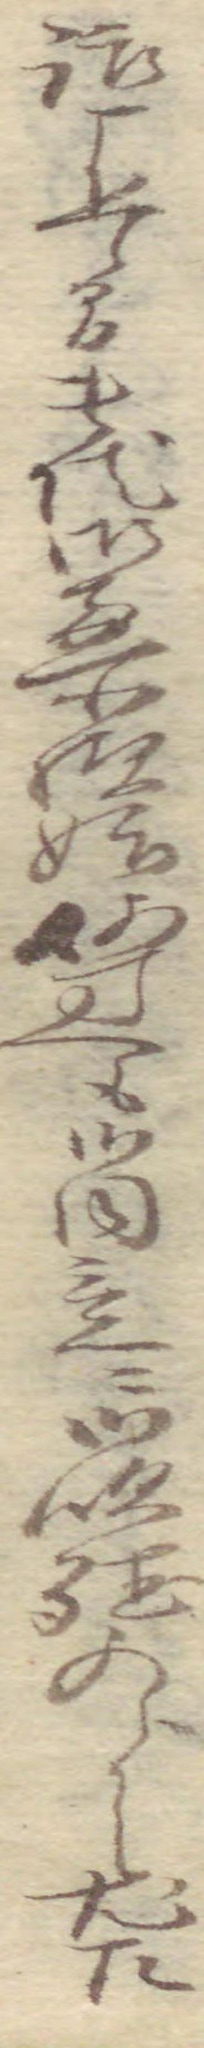話申上候間貴代御両所様始何方へも御同意ニ御吹聴可被下候尤左
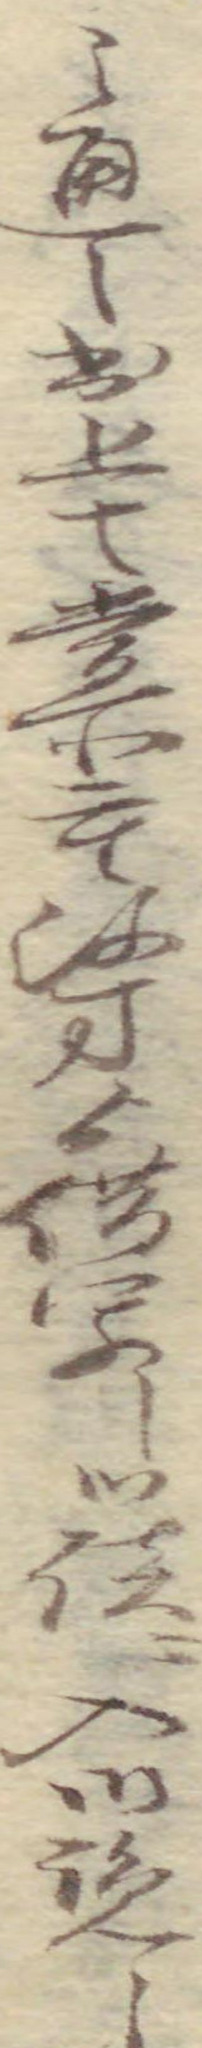之通之書上は当所ニて役方ゟ借写し候供ニ入御覧候
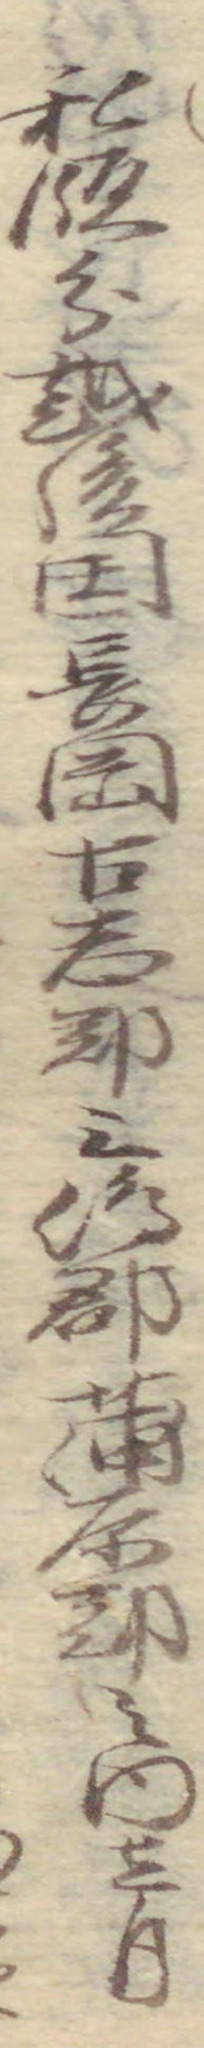私領分越後国長岡古志郡三島郡蒲原郡之内去月
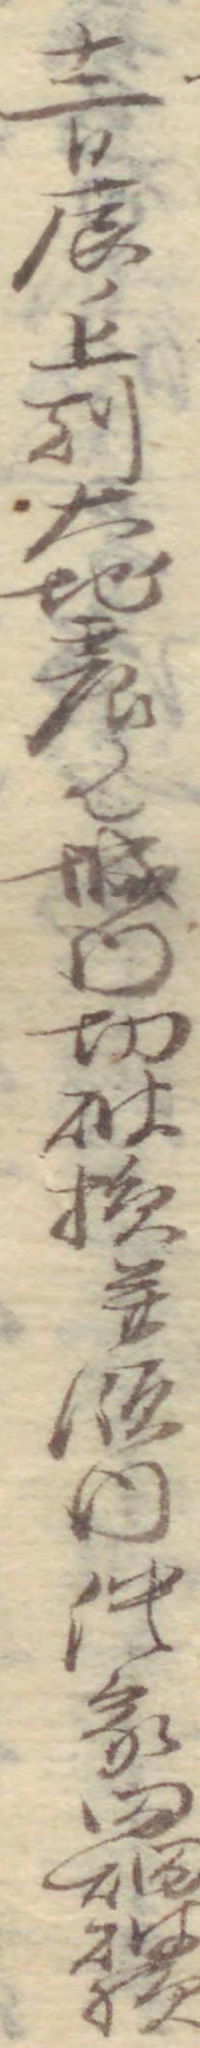十二日辰ノ上刻大地震ニて城内切破損幷領内潰家田畑破損
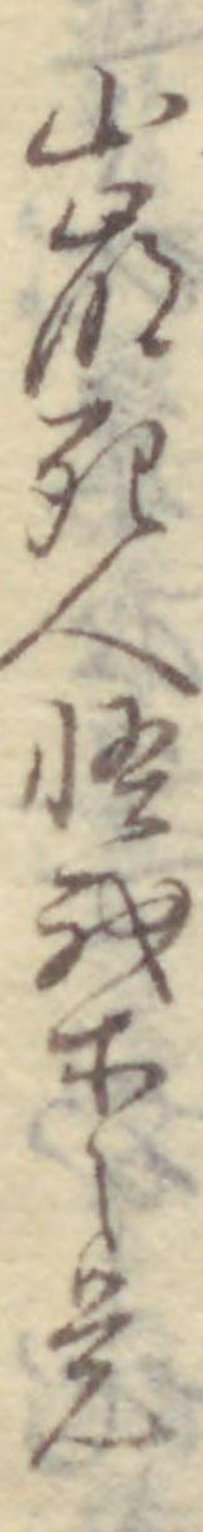山崩死人怪我等之覚
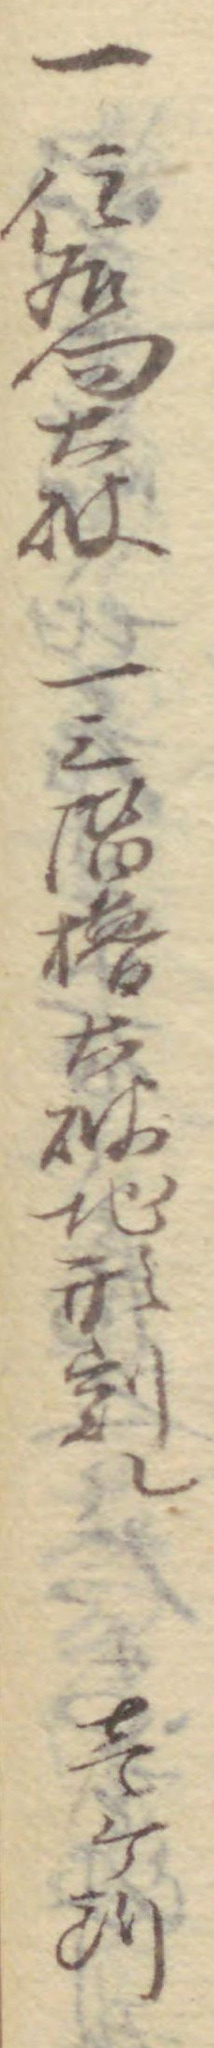一住居向大破一三階櫓大破地形割レ壱ケ所
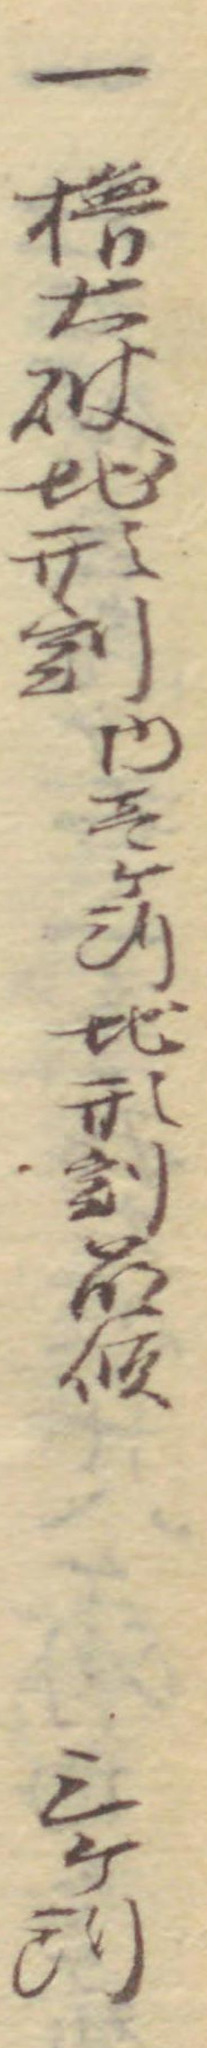一櫓大破地形割内壱ケ所地形割崩傾三ケ所
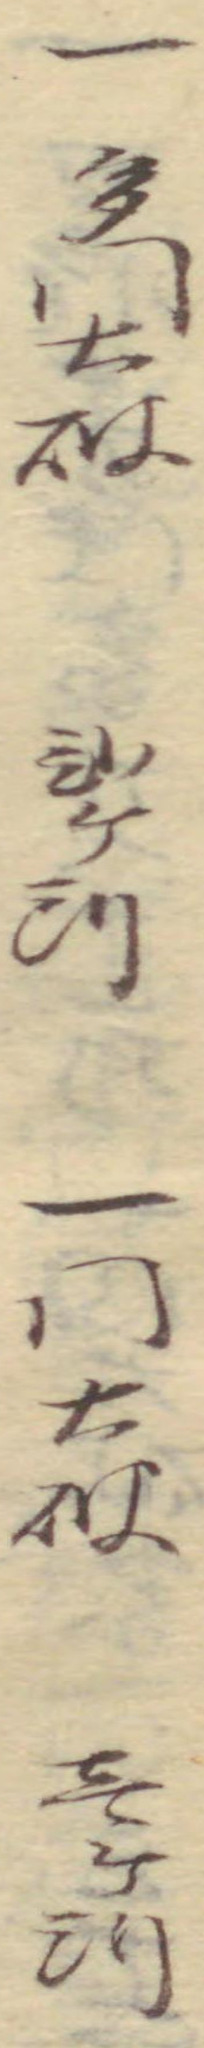一多門大破弐ケ所一門大破壱ケ所
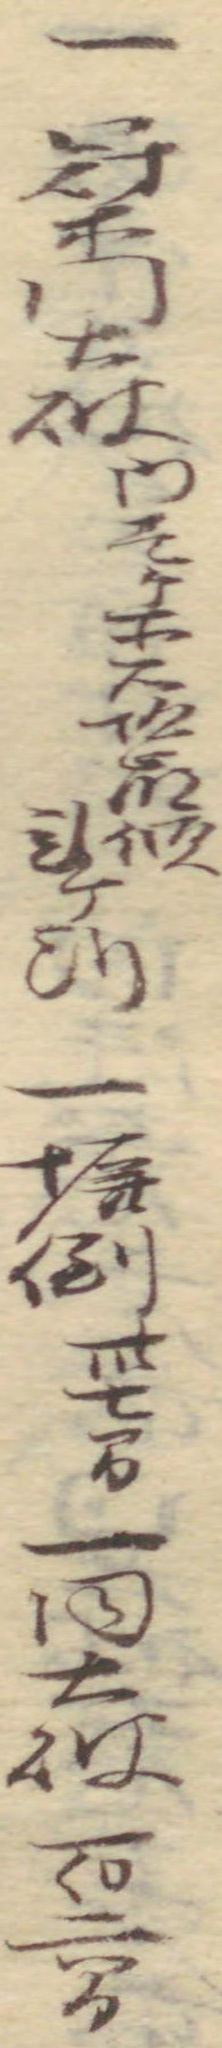一冠木門大破内壱ケ所石垣崩傾弐ケ所一塀倒卅七間一同大破百弐間
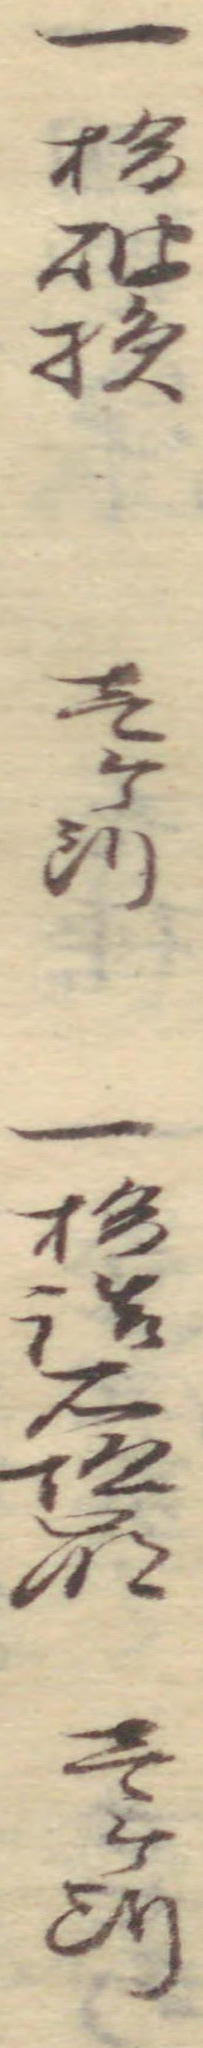一橋破損壱ケ所一橋詰石垣崩壱ケ所
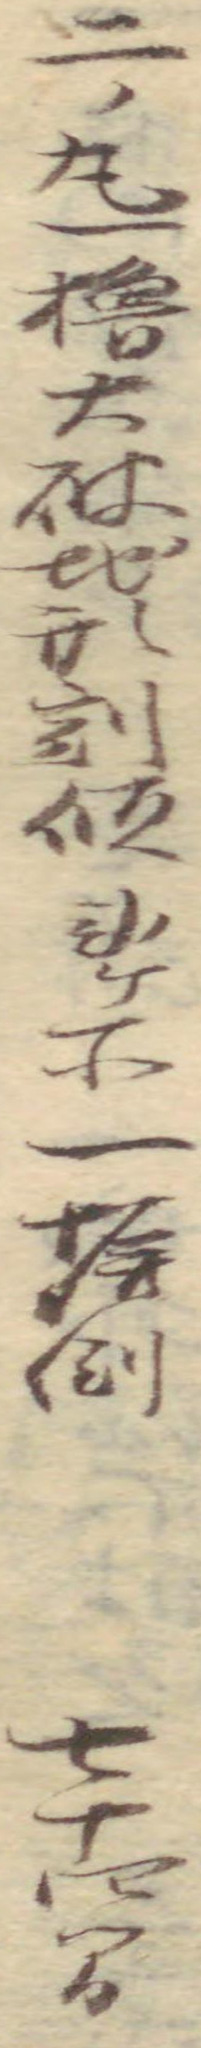二ノ丸一櫓大破地形割傾弐ケ所一塀倒七十四間
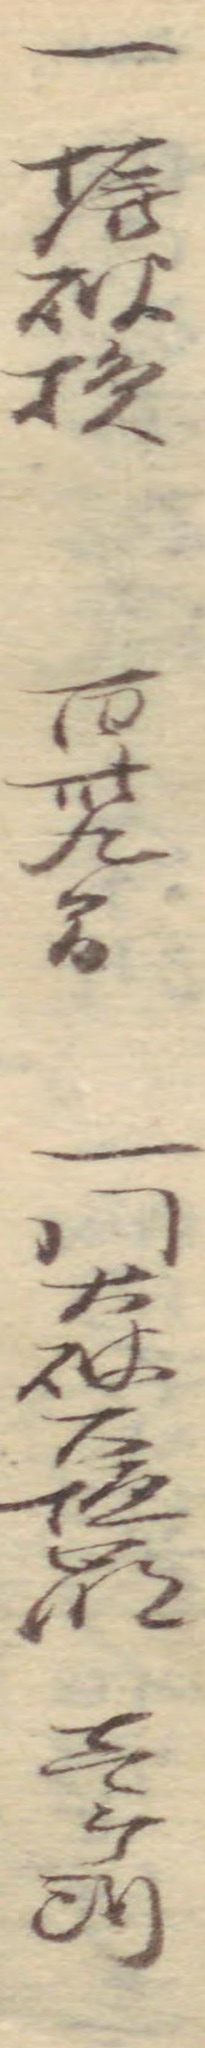一塀破損百卅九間一門大破石垣崩壱ケ所
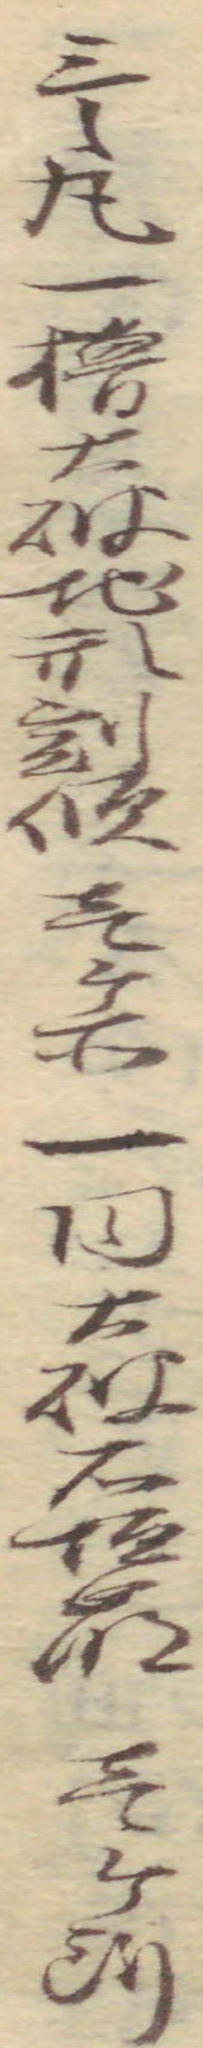三ノ丸一櫓大破地形割傾壱ケ所一同大破石垣崩壱ケ所
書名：鶯宿雑記. 巻199-200
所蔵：国立国会図書館 National Diet Library, JAPAN
